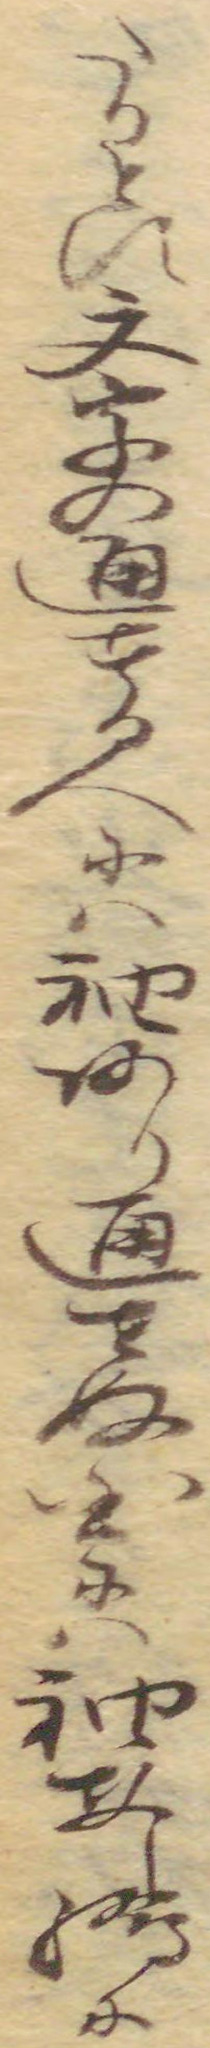たりとす文字の通する人には神あり通せぬ国には神なし絵に

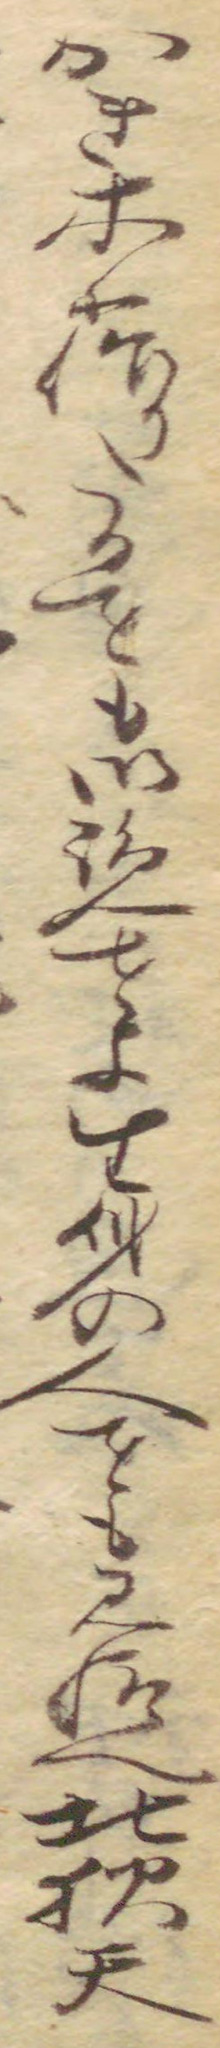かき木に作りたるをも御覧せよ生身の人をも見給へ北狄天
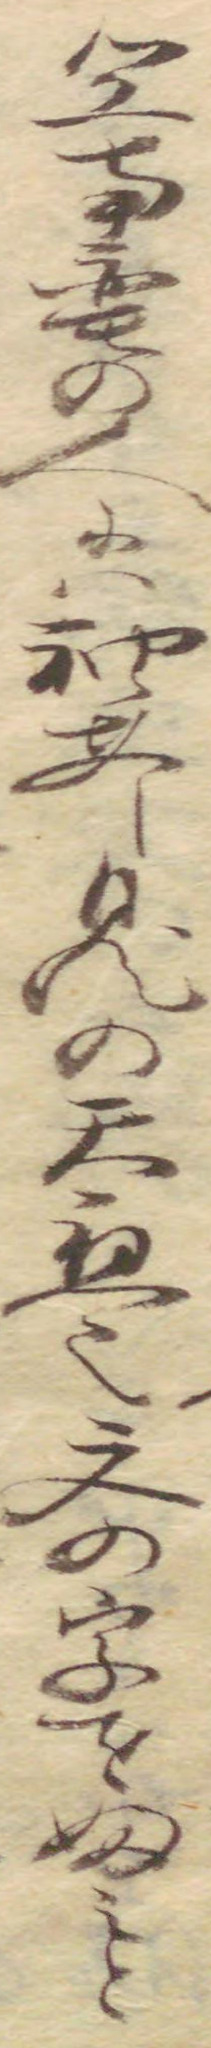竺南蛮の人には神なし自然の天応也文の字をふみと
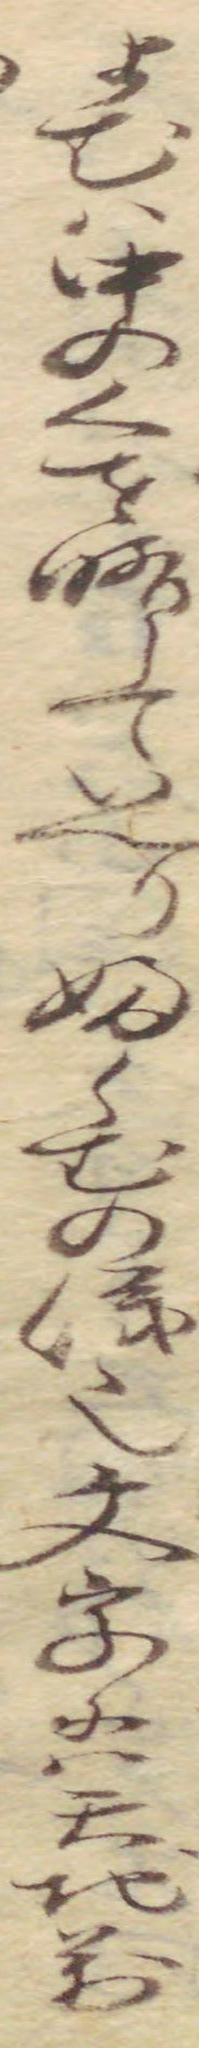よむは中のくを略していへりふくむの儀也文字には天地万
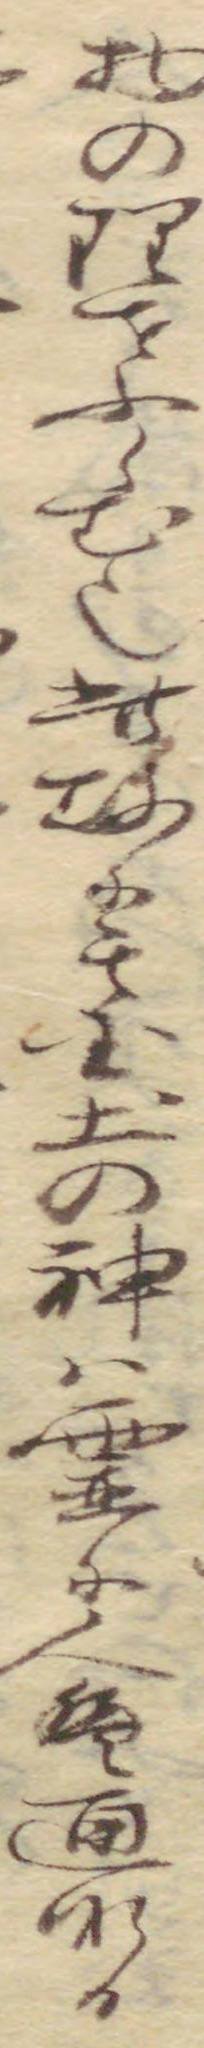物の理をふくむ也此故に其国土の神は霊に人は通なる
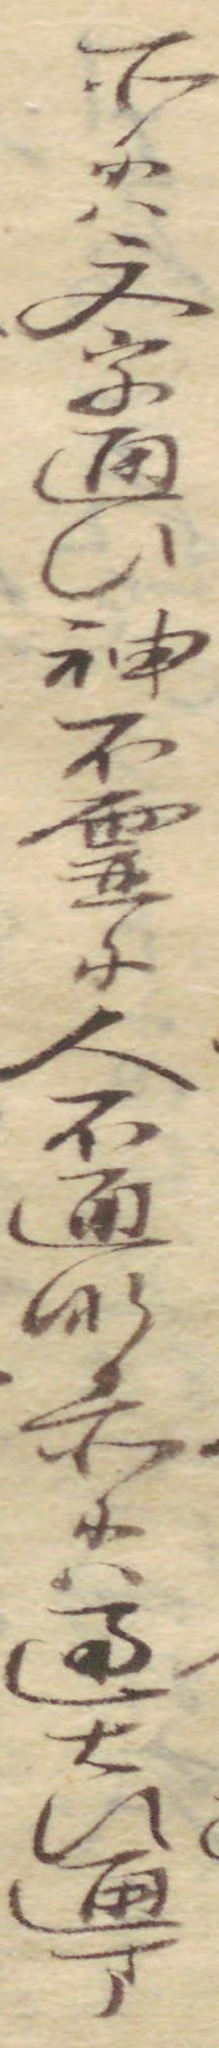所には文字通ひ神不霊に人不通なる所には通はす通す
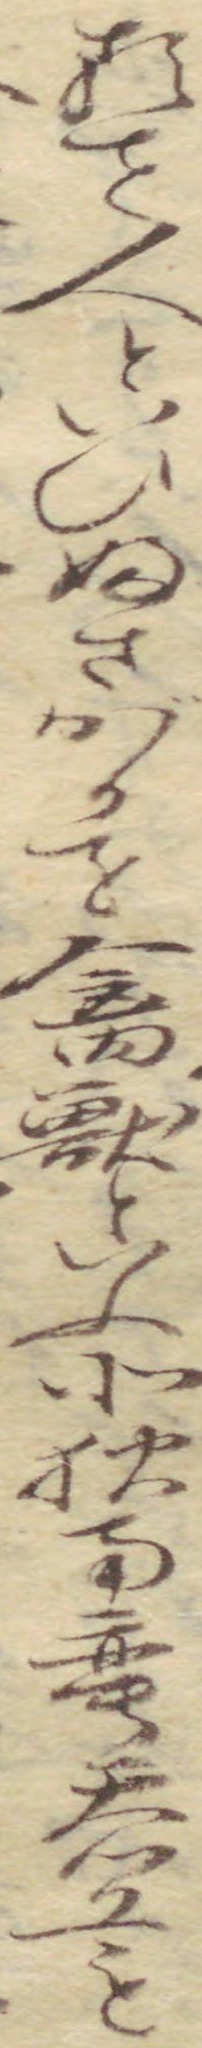るを人といひふさがるを禽獣といふ北狄南蛮天竺も
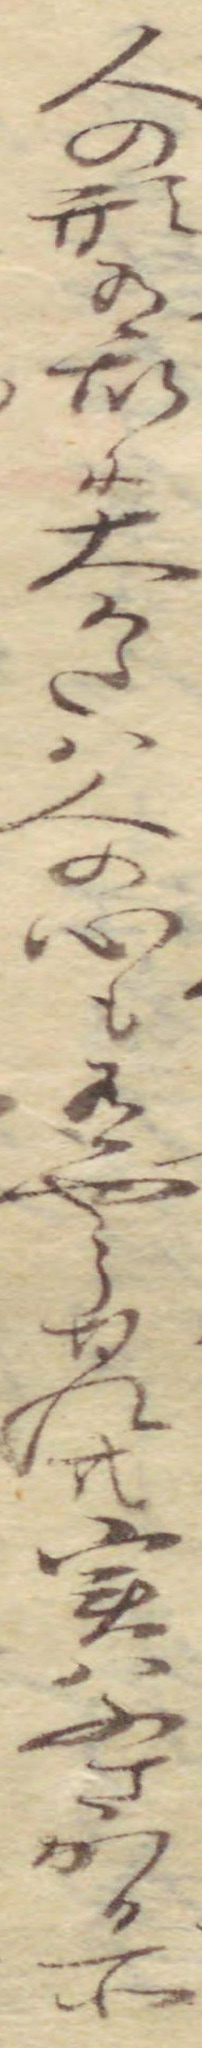人の形有故に大かたは人の心も有やうなれ共実はふさかる所
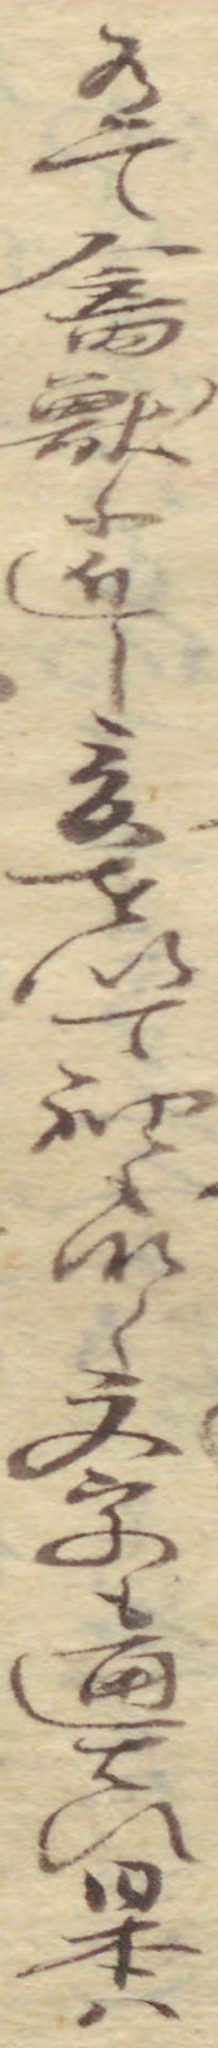有て禽獣に近し爰を以て神もなく文字も通はす日本は
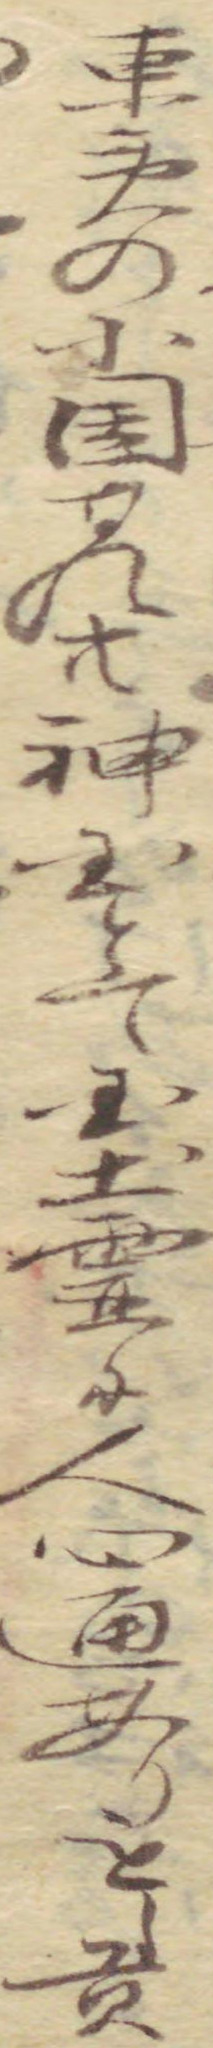東夷の小国なれ共神国とて国土霊に人心通なりもし貢
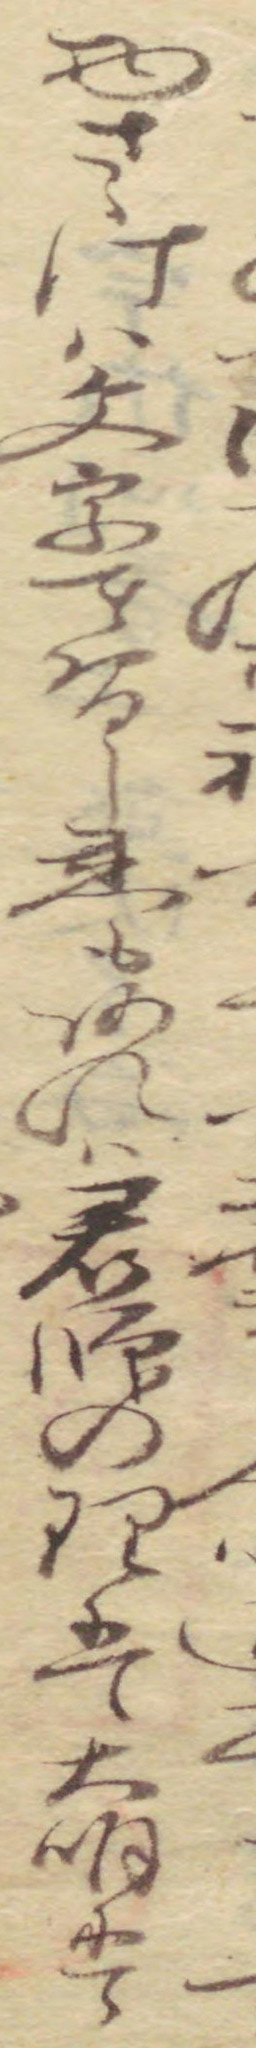物さゝけは文字を習し恩もあれは君師の理にて大明にこ
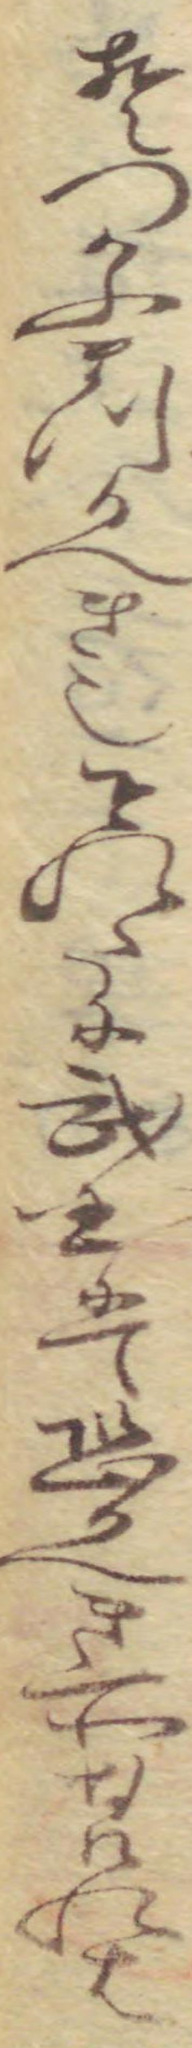そつかふまつるへき也それたに武国にて恐るへき所なけれは
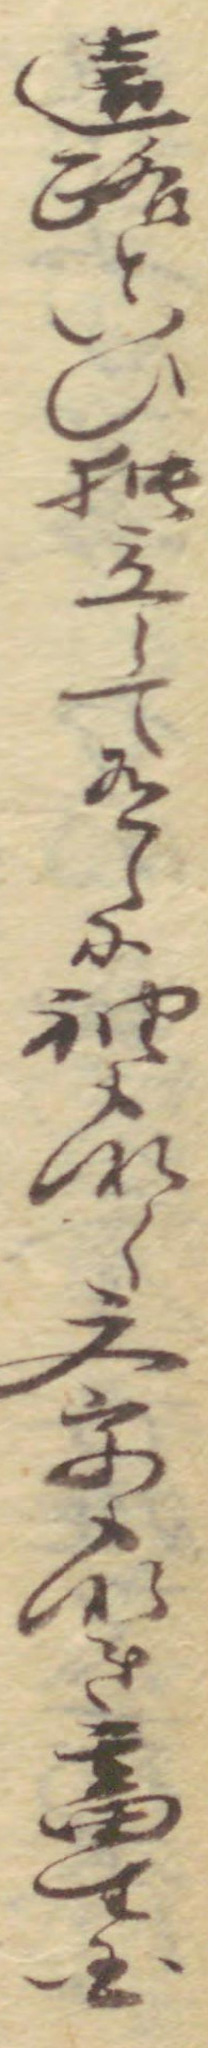遠路といひ独立して有しに神もなく文字もなき畜生国
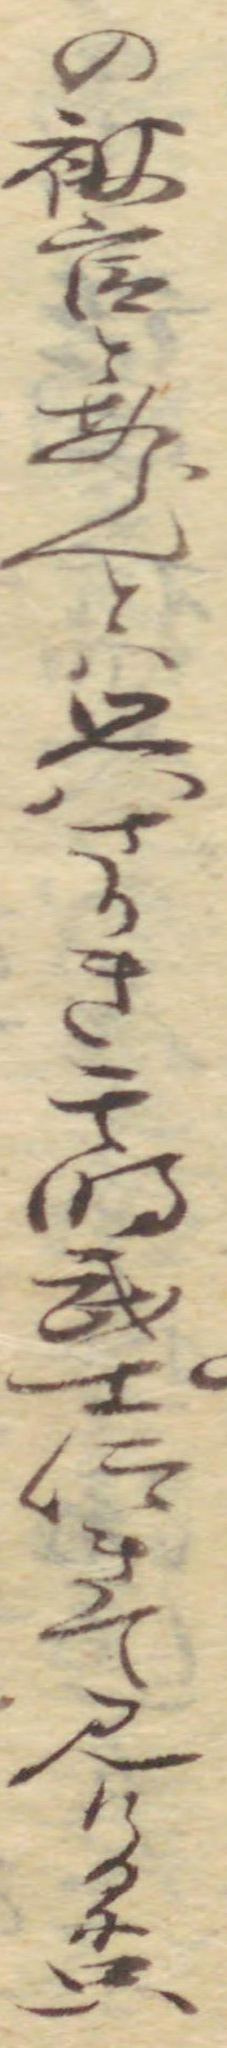の被官とならんとは思はさりき其時武士仰きて見けるに只
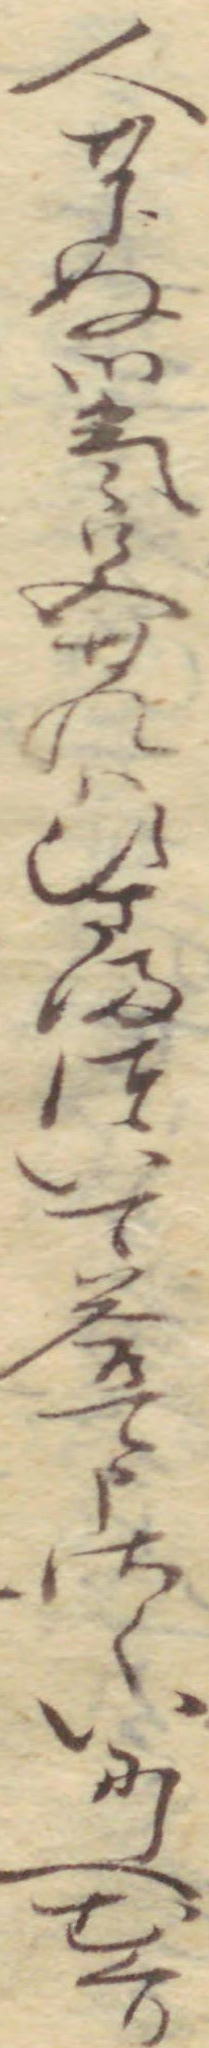人ならぬ御気色なれはひさまついて答て申さくいにしへむくり
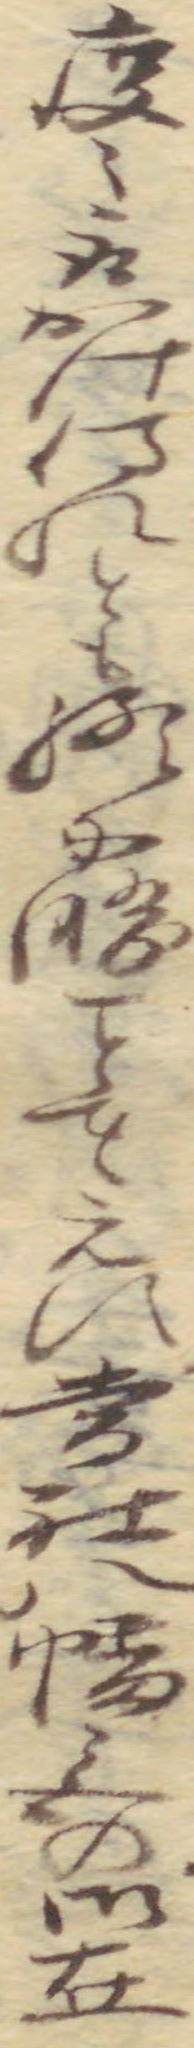度〻取かけ侍れとも終に勝ことをえす当社八幡宮の御在
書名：鶯宿雑記. 巻263-264
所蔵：国立国会図書館 National Diet Library, JAPAN
